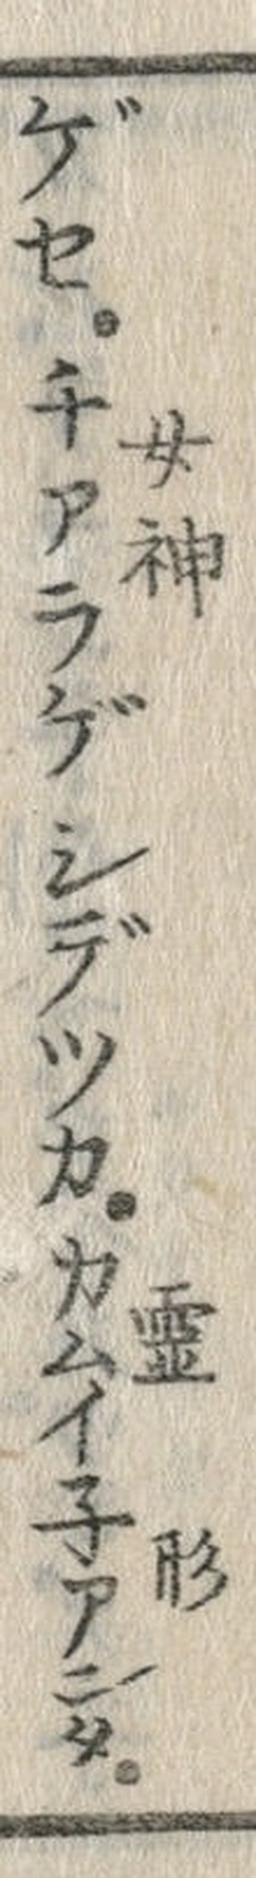ゲセ。チアラゲシデツカ。カムイネアンタ。
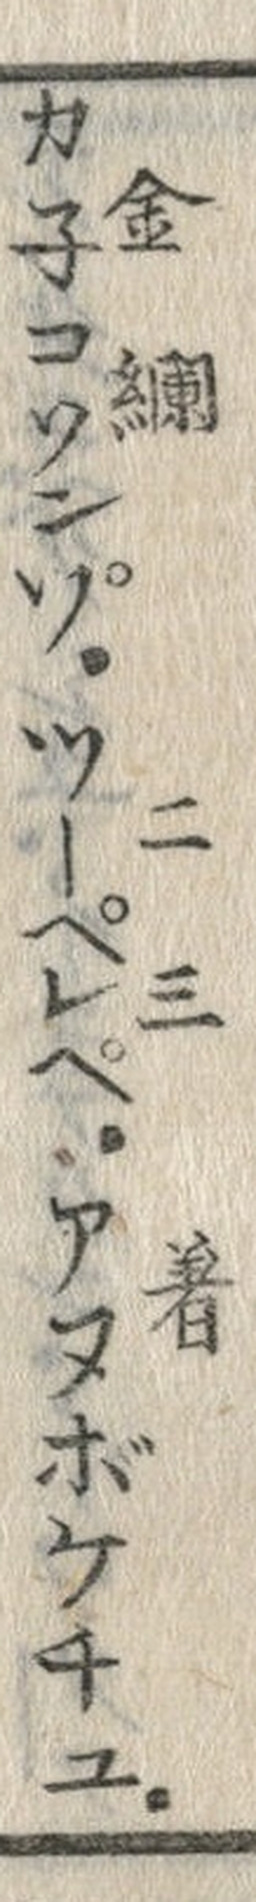カネコソンツ゚。ツーペレペ。アヌボケチユ。
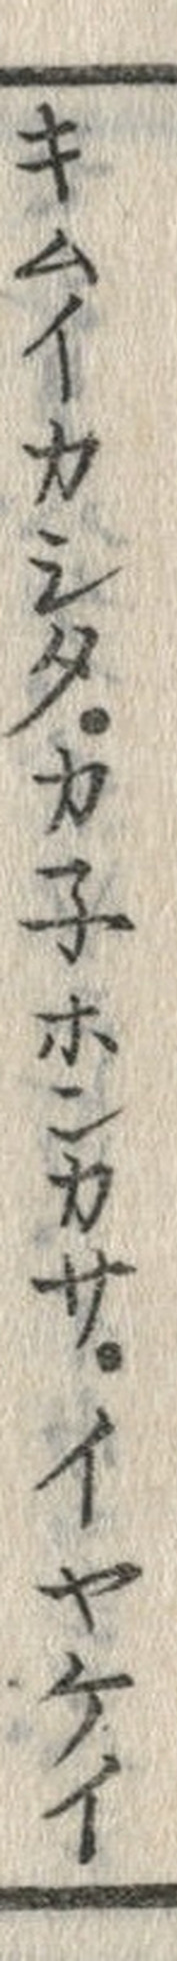キムイカシタ。カネホンカサ。イヤケイ
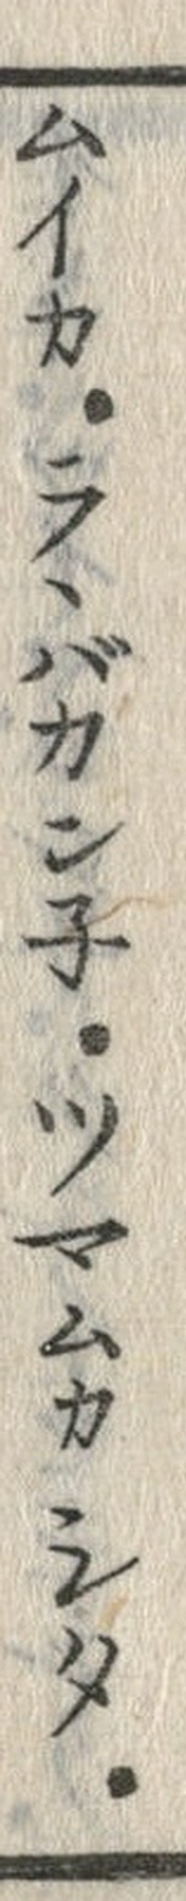ムイカ。ラゝバカンネ。ツマムカシタ。
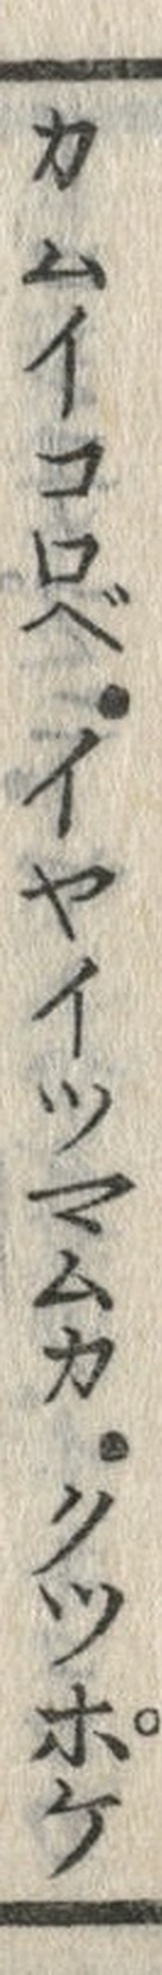カムイコロベ。イヤイツマムカ。クツポケ
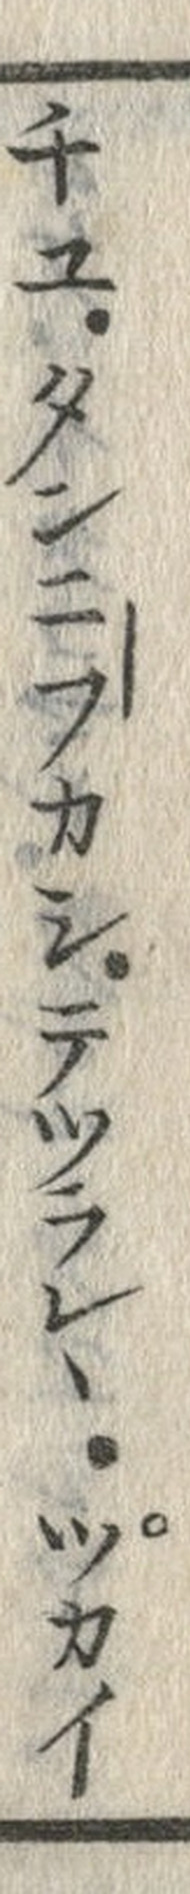チユ。タンニフカシ。テツラレヽ。ツ゚カイ

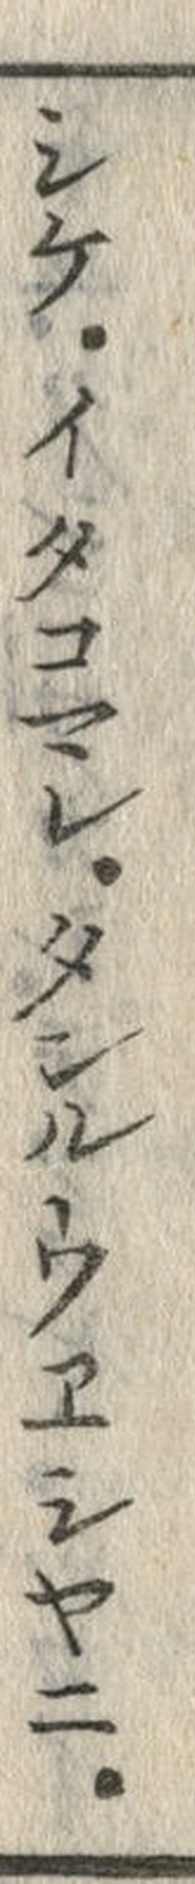シケ。イタコマレ。タンルウヱシヤニ。
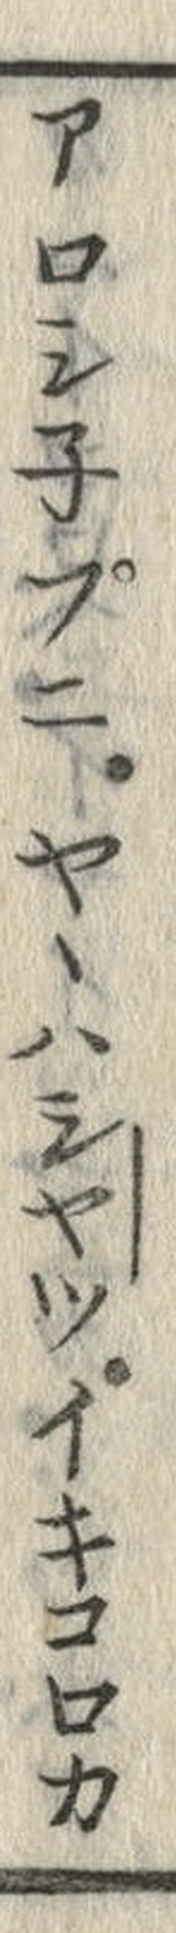アロシネプニ。ヤヽハシヤツ。イキコロカ
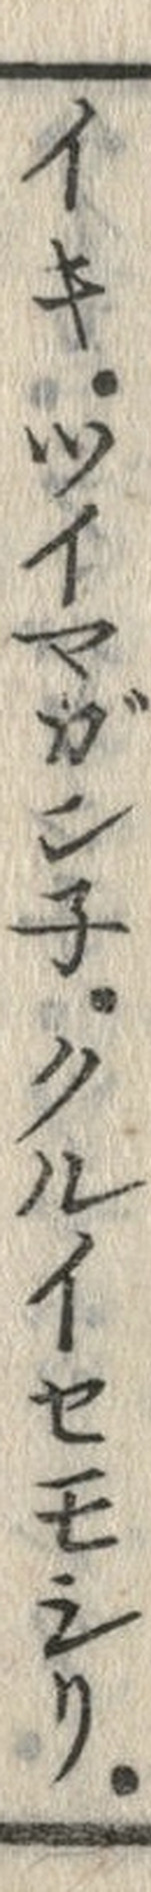イキ。ツイマガンネ。クルイセモシリ。
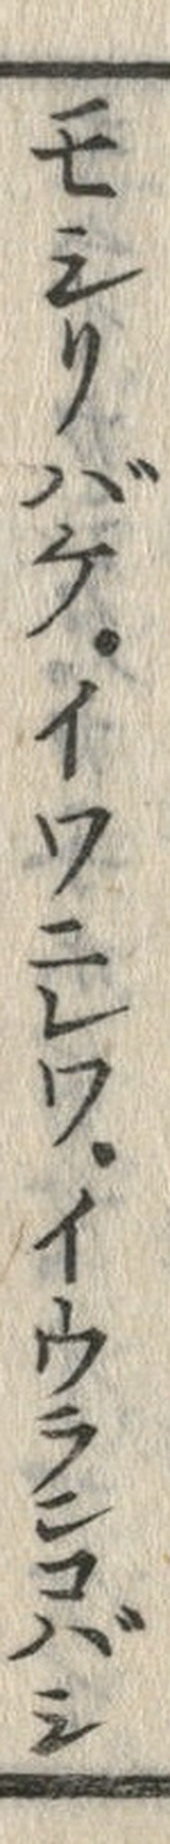モシリバケ。イワニレワ。イウランコバシ
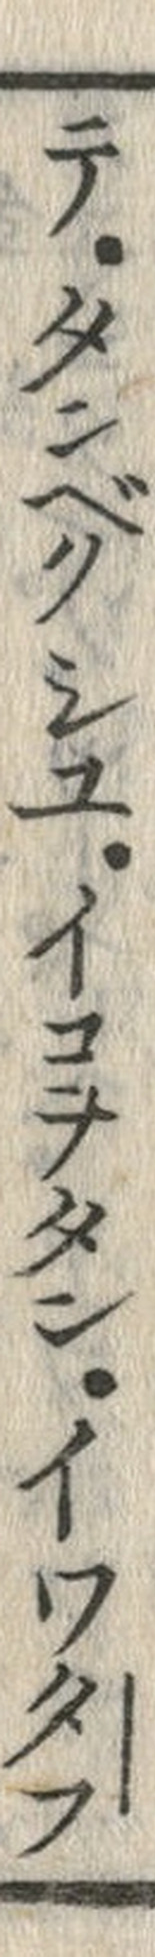テ。タンベクシユ。イコヲタン。イワタフ
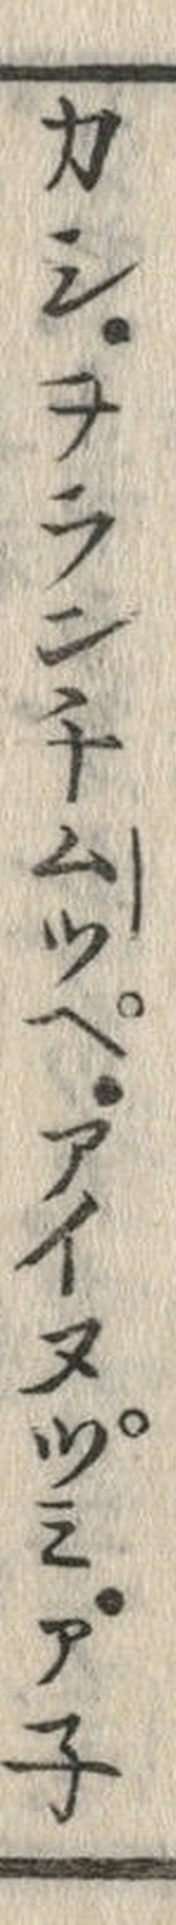カシ。ヲランチムツペ。アイヌツ゚ミ。アネ
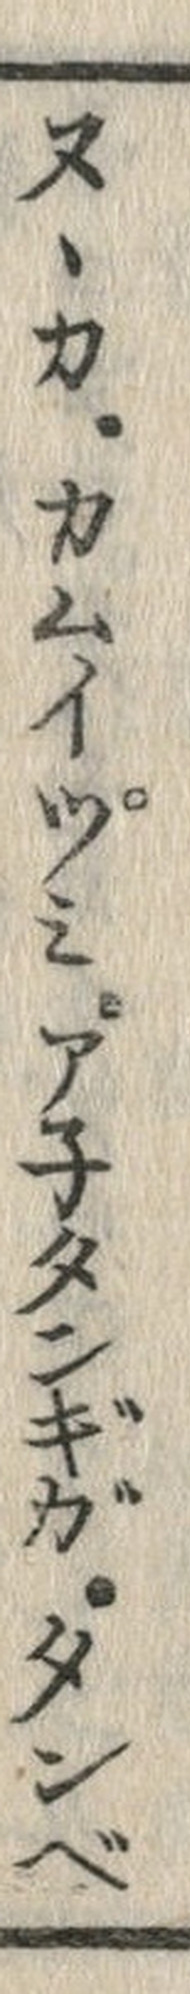ヌヽカ。カムイツ゚ミ。アネタンギガ。タンベ
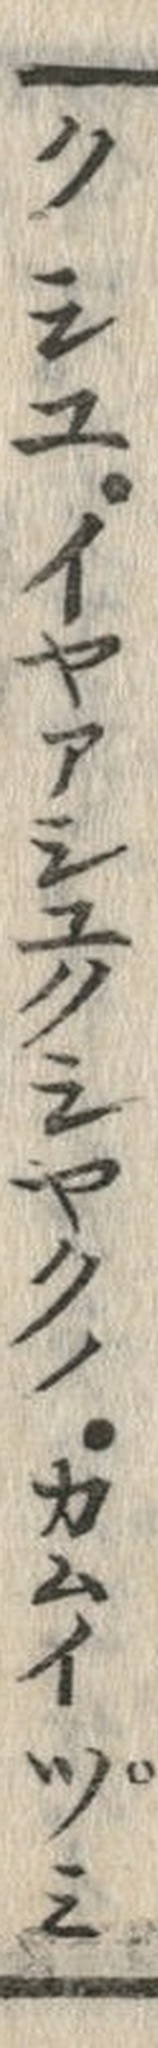クシユ。イヤアシユクシヤクノ。カムイツ゚ミ

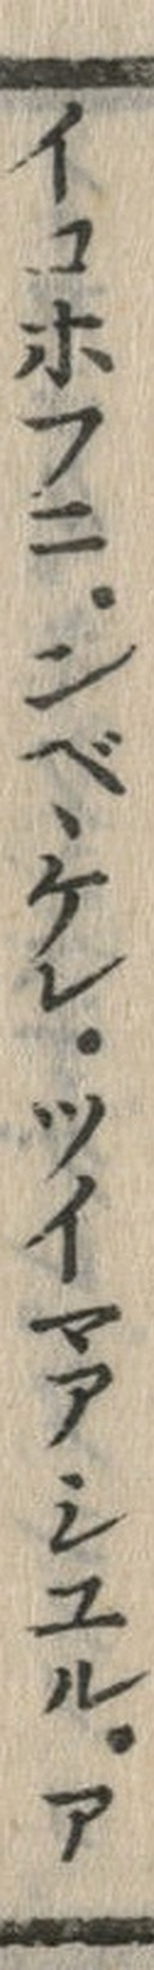イコホフニ。ンベヽケレ。ツイマアシユル。ア
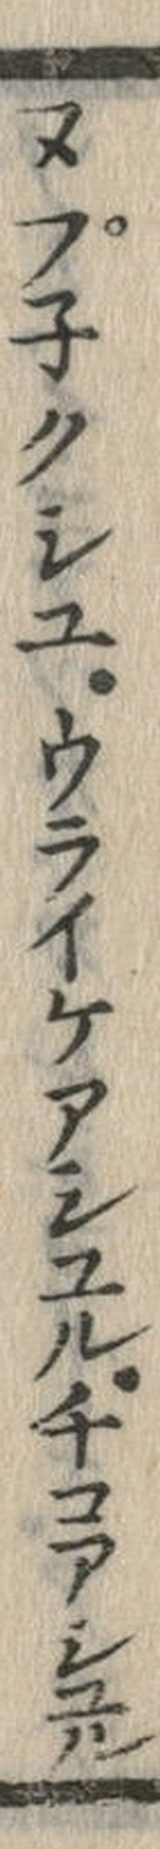ヌプネクシユ。ウライケアシユル。チコアシユル
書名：蝦夷方言藻汐草　坤巻
